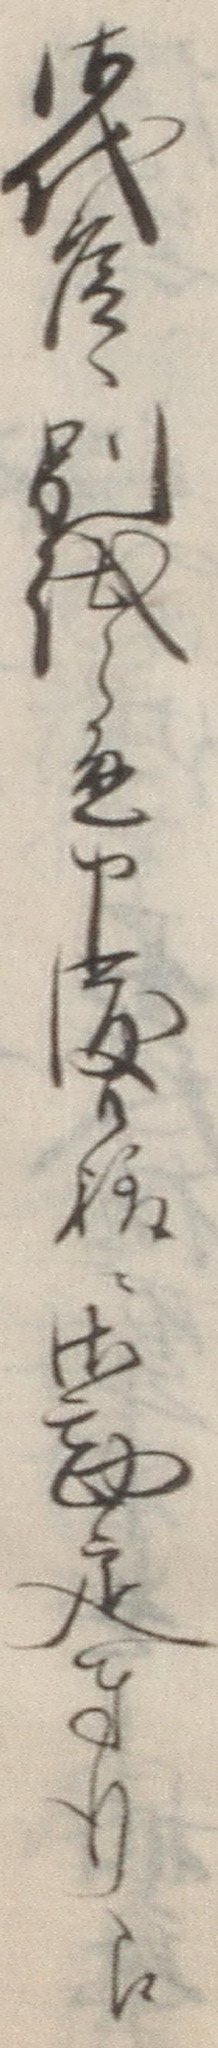御代官之別儀之通申渡候様ニ御勘定奉行え
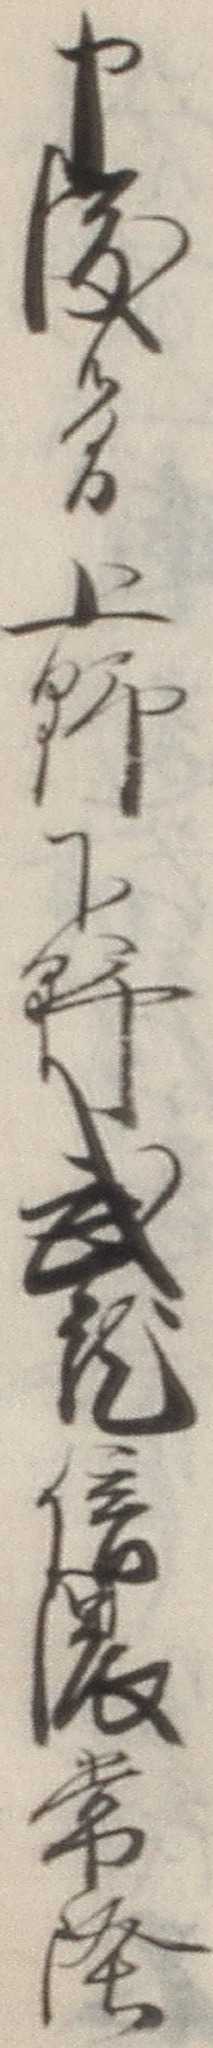申渡候間上野下野武蔵信濃常陸
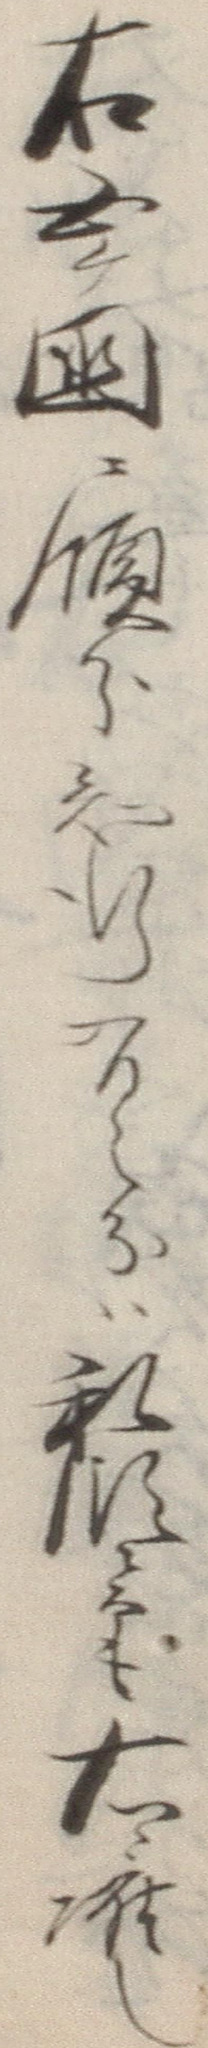右五ケ国ニ領分知行有之分ハ私領ニ而も右ニ准し
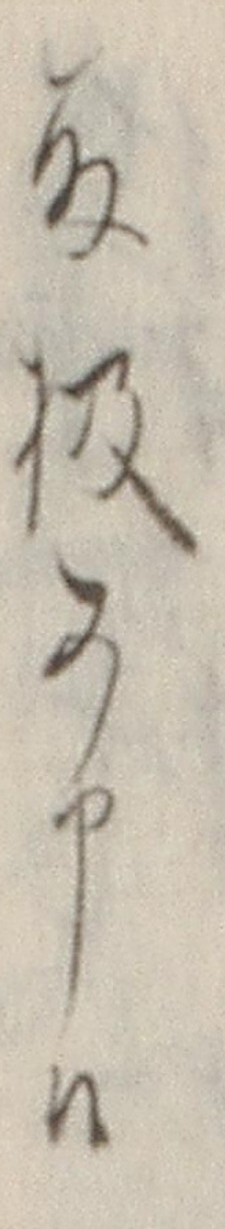取扱可申候
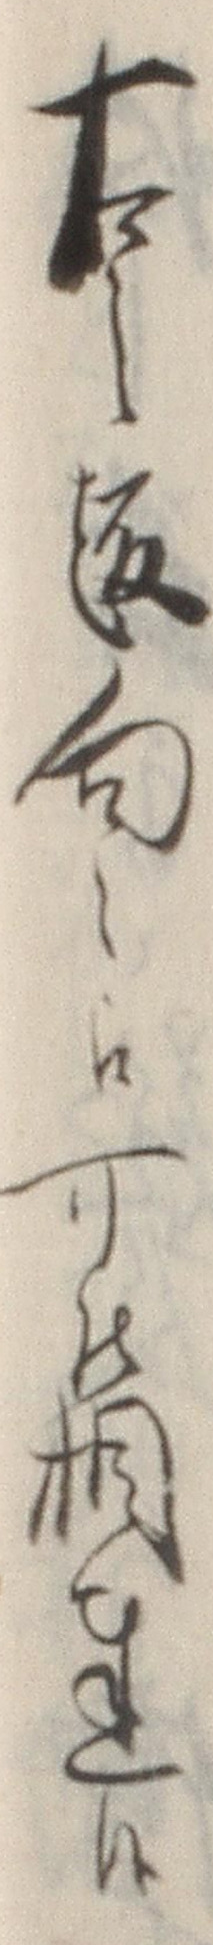右之趣向々え可被相達候
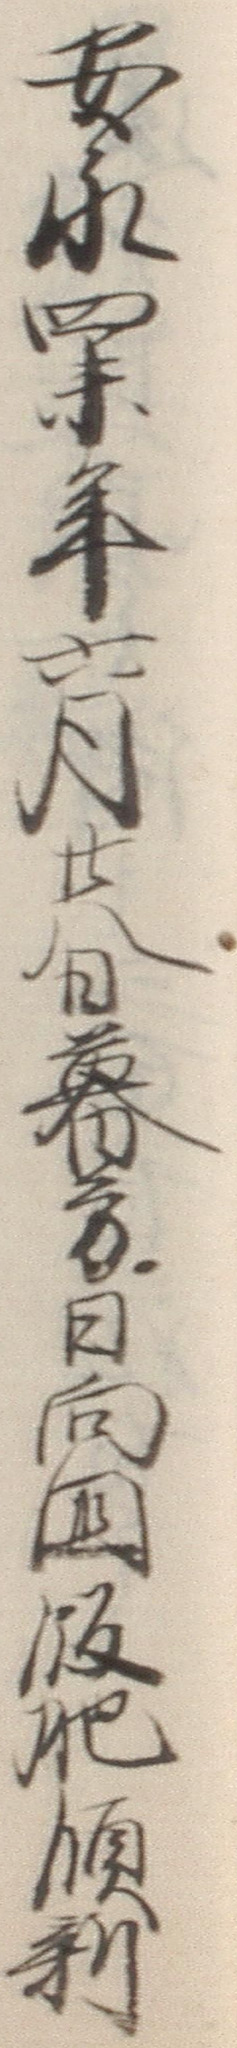安永四未年六月廿八日暮方日向国飫肥領新
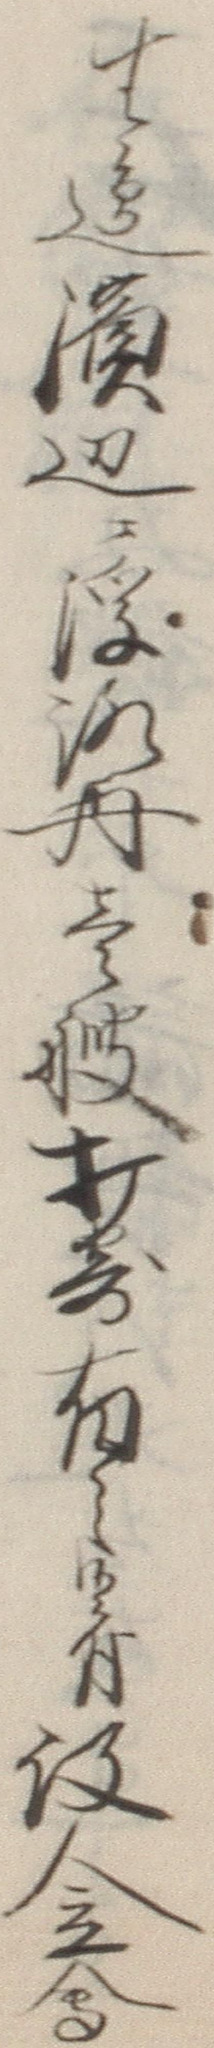生辺浜辺ニ浮路舟壱艘打寄有之候ニ付役人立会
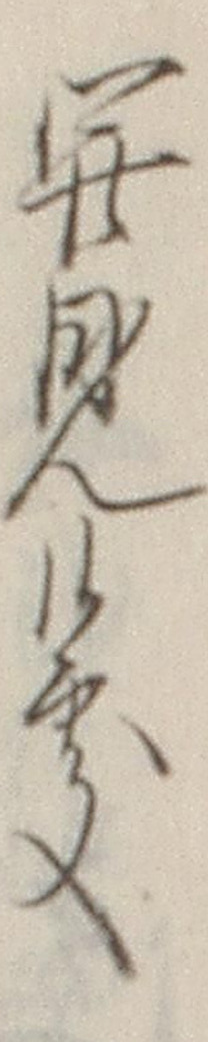開見候処
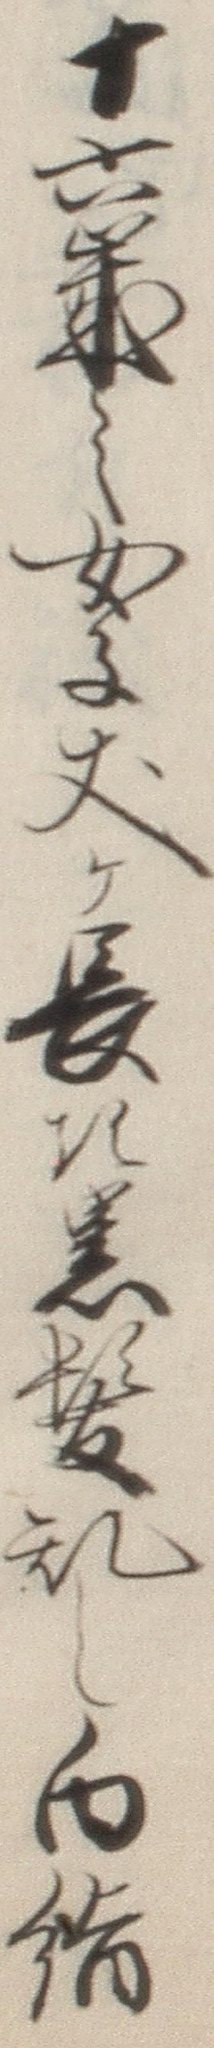十六歳之女子丈ケ長き黒髪乱し白絹
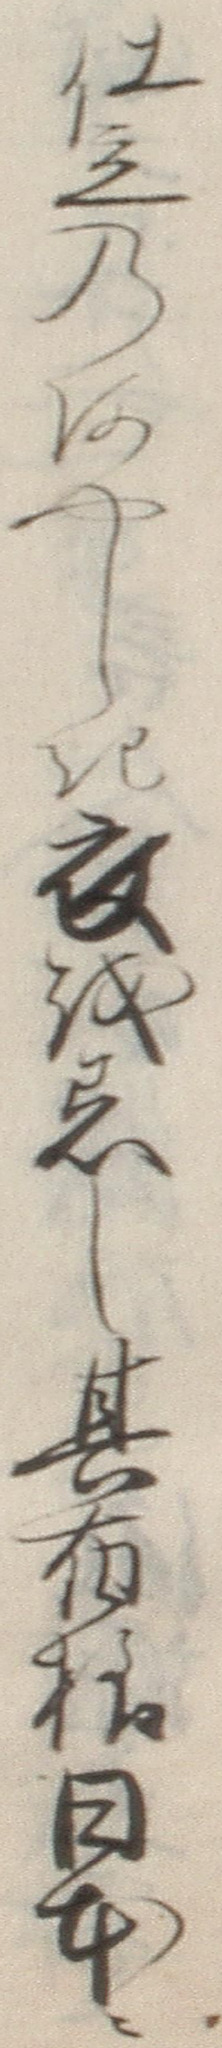仕立のあやしき衣を着し其有様日本ニ
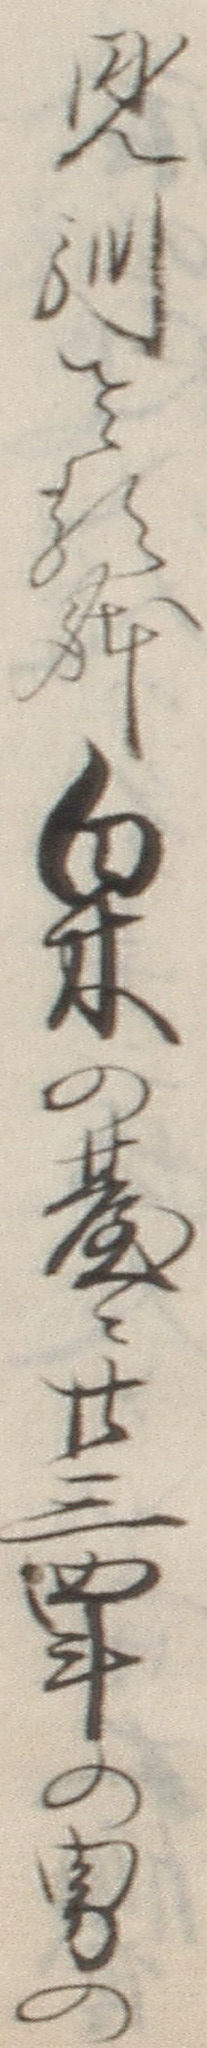見馴さる躰白木の台ニ廿三四斗の男の
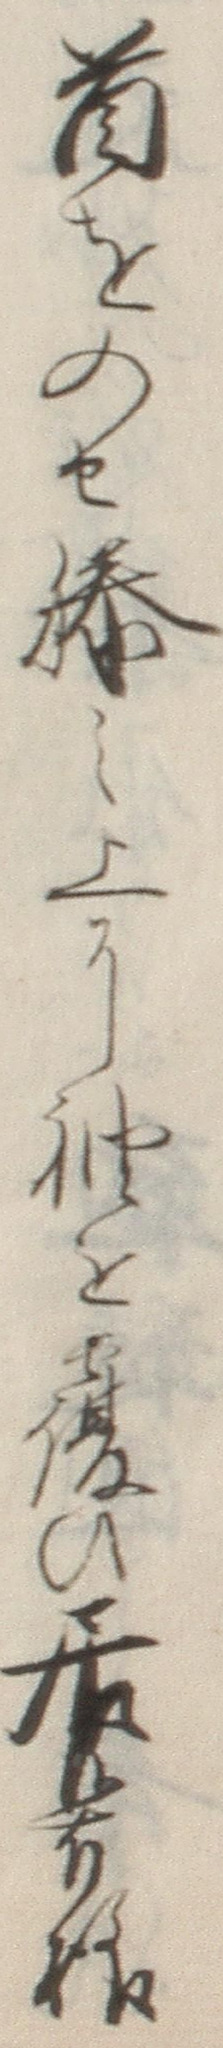首をのセ膝之上に袖を覆ひ居候有様
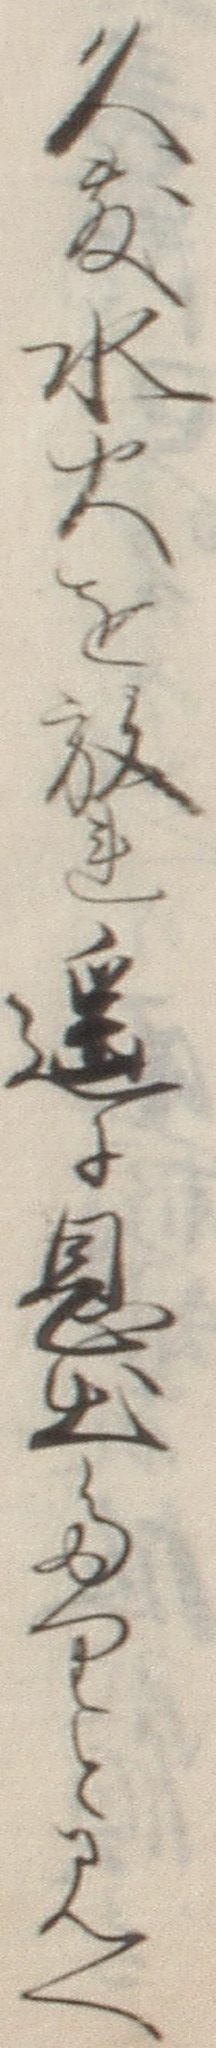久敷水火を放れ遥に息出たりと見え
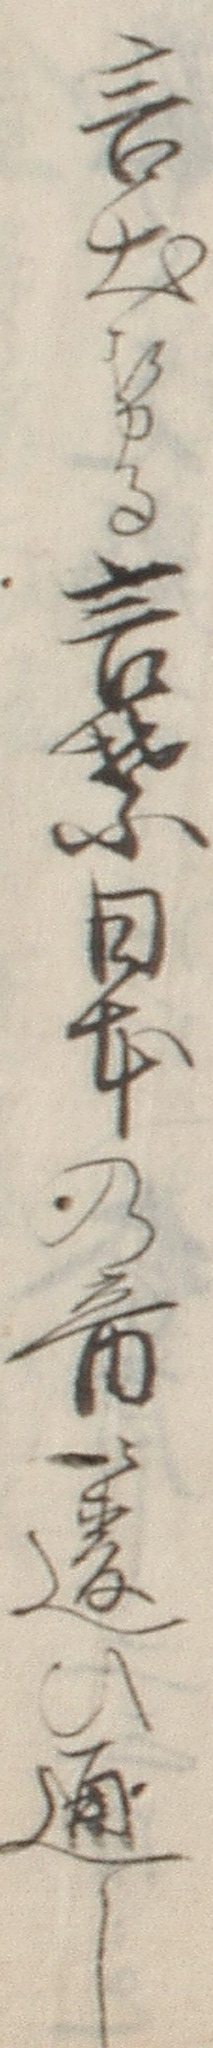言出替る言葉日本乃音ニ違ひ通し

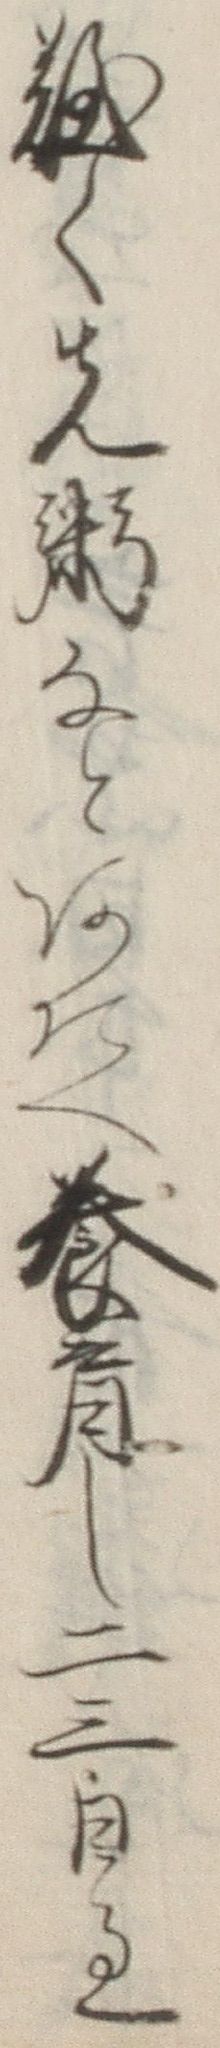難く先粥なとあたへ養育し二三日過
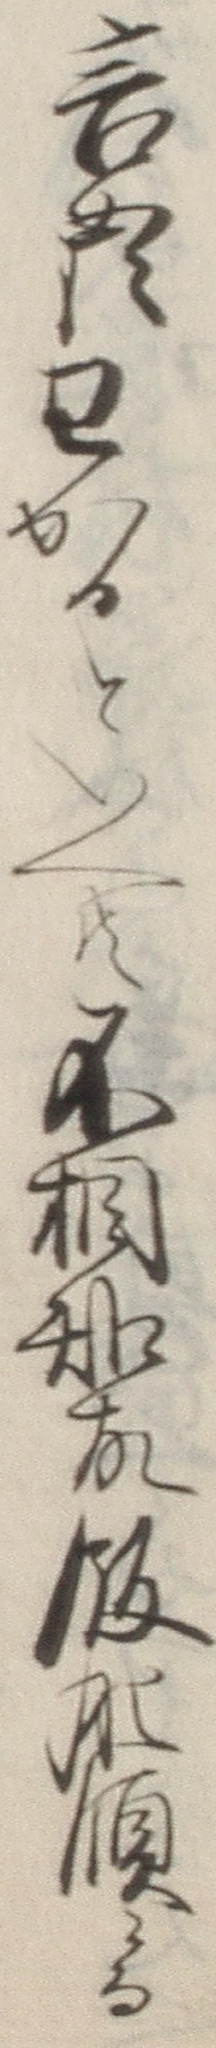言語わかるといへ共不相知故飫肥領ニ而
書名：[諸国災害記録]
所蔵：東京大学地震研究所図書室 Earthquake Research Institute Library, The University of Tokyo, JAPAN
